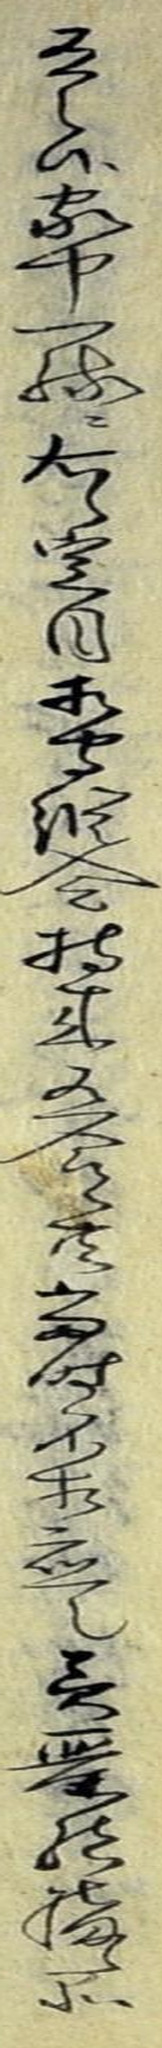有之候家中一統ニ右之定目相守縦令持来有之候共当時不相応之美麗結構之品
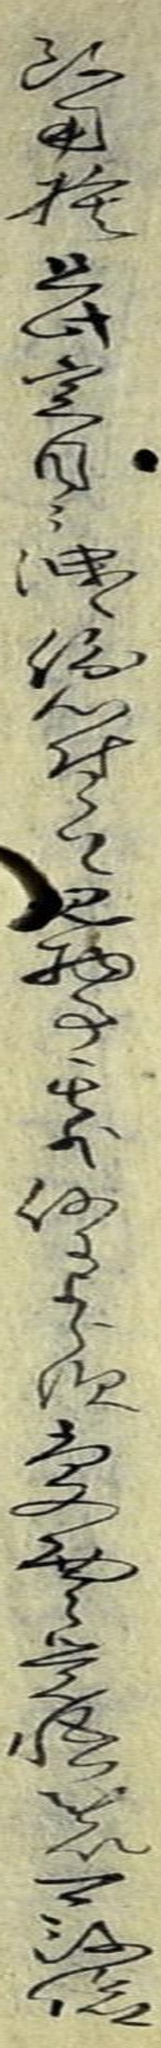致用捨且此定目ニ洩候儀心付候ハヽ物事其外何によらす尚又面々覚悟を以可致倹
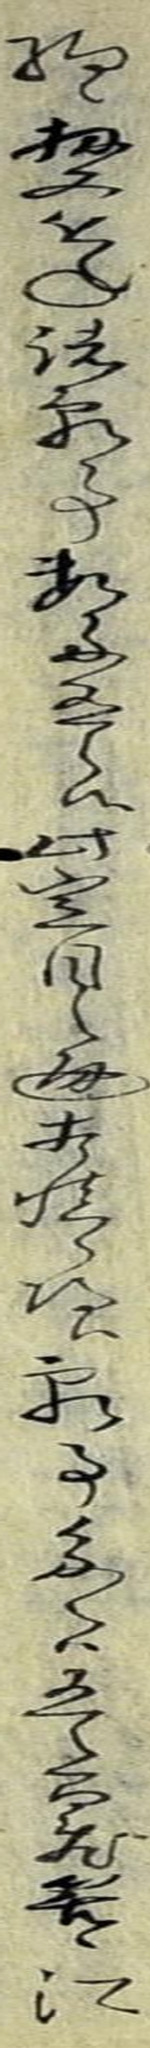約候扨又近年諸願事数多有之候此定目之通相慎候得ハ願事多くハ有之間敷筈候江
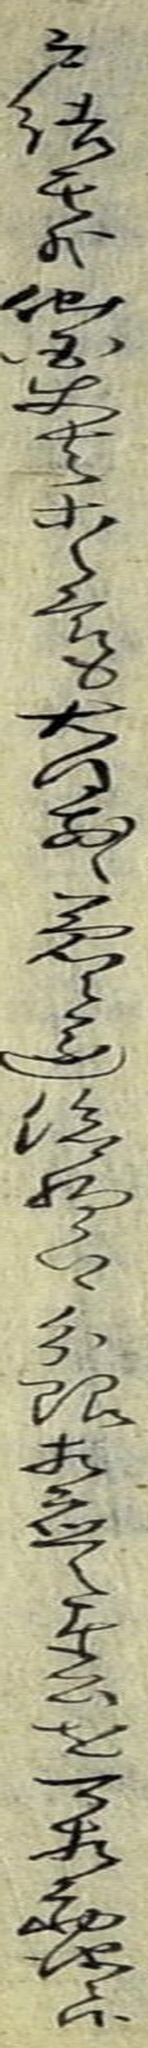戸詰其外他国使者等之節も右同前候兼々遂倹約候ハヽ分限相応之奉公を可相勤儀ニ候
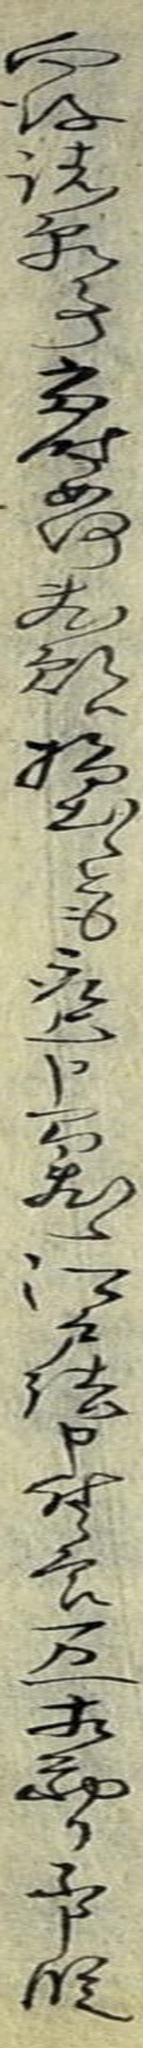向後諸願事当時如何敷願ハ指出候とも取上申間敷候江戸詰申付候節万一相勤り不申段
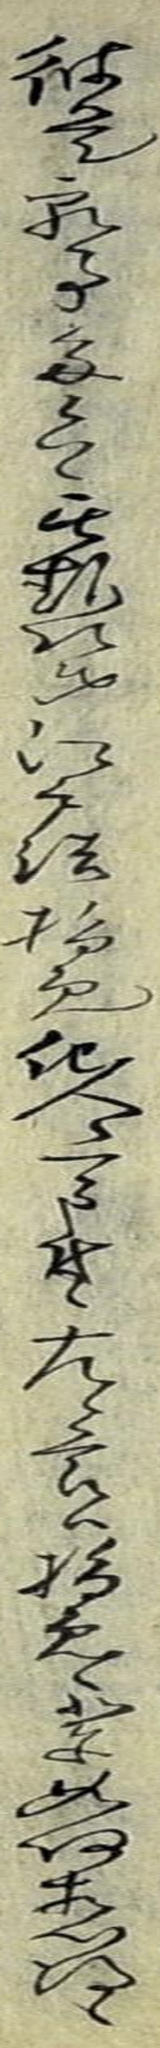彼是願事多候ハヽ其趣次第江戸詰指免他人へ可申付候左候節ハ指免候輩如何相心得候
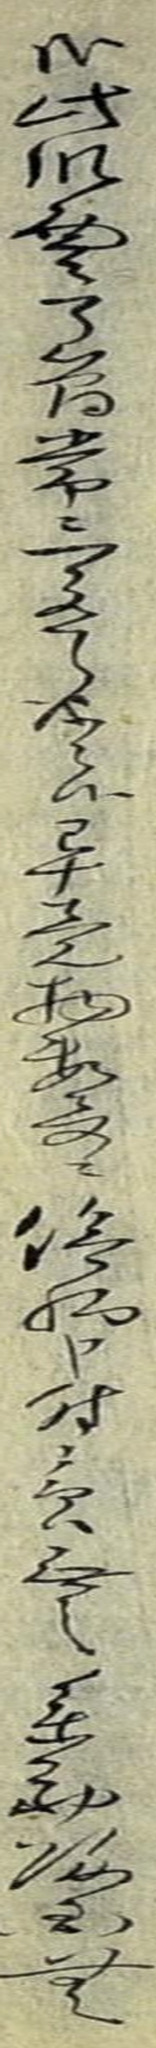哉此段面々了簡常ニ可有之儀ニ候畢竟物数奇ニ倹約申付ニ而ハ無之参勤帰国無
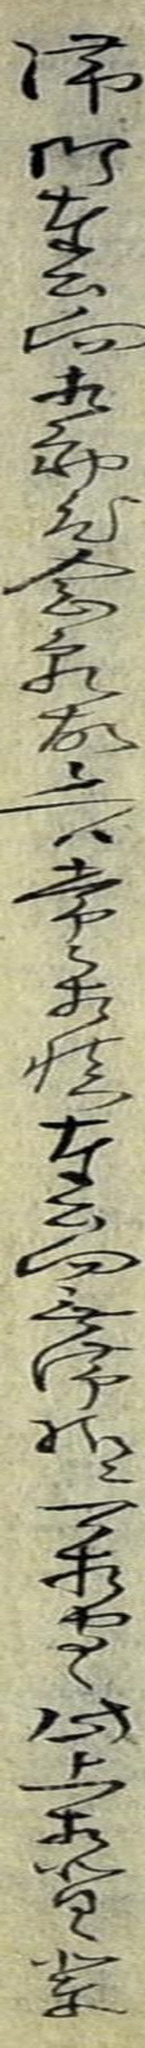滞御奉公向相勤度念願故候ヘハ常ニ相慎奉公向無滞様ニ可相守候此上相背候輩
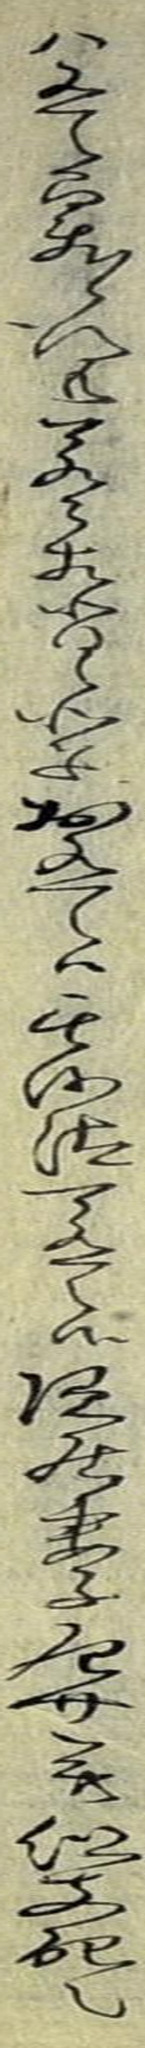ハ有之間敷候得共若々相背候輩於有之ハ其沙汰可有之候隠居妻子厄介并組支配之
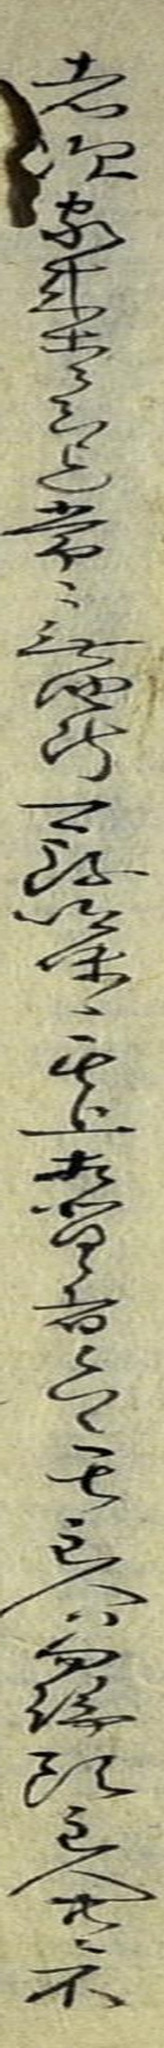者次家来等ニ至迄常ニ無油断可致吟味候其上相背候者候ハヽ其主人ハ勿論頭主人共ニ不
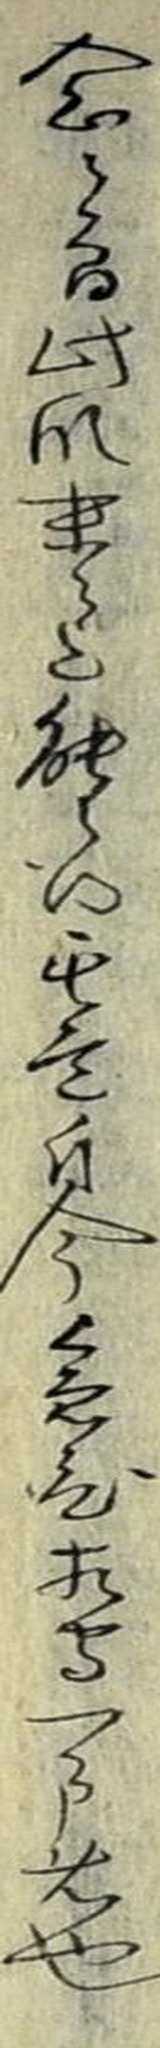念ニ候間此段末々迄能々得其意自今急度相守可申者也
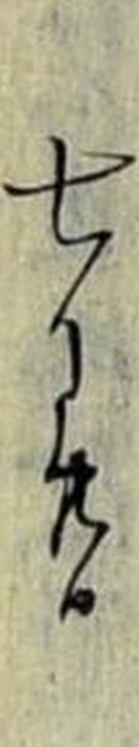七月廿日
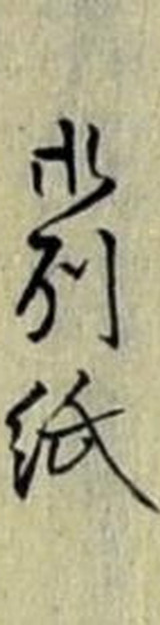御別紙
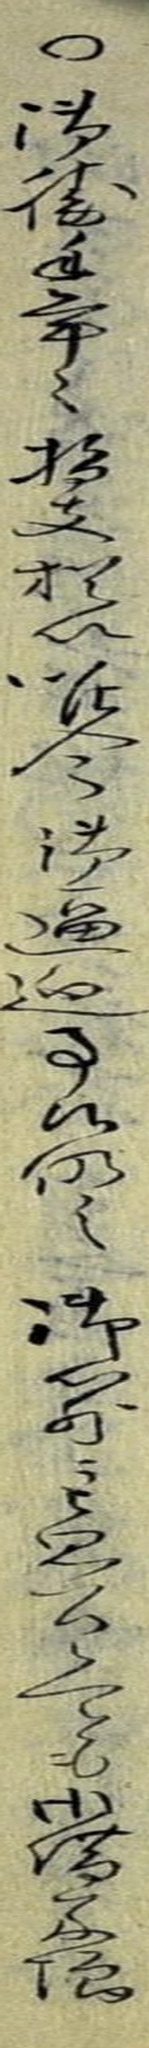〇御勝手年々指支猶以唯今御逼迫事候仍之御心外ニ被思召候へとも御借米増
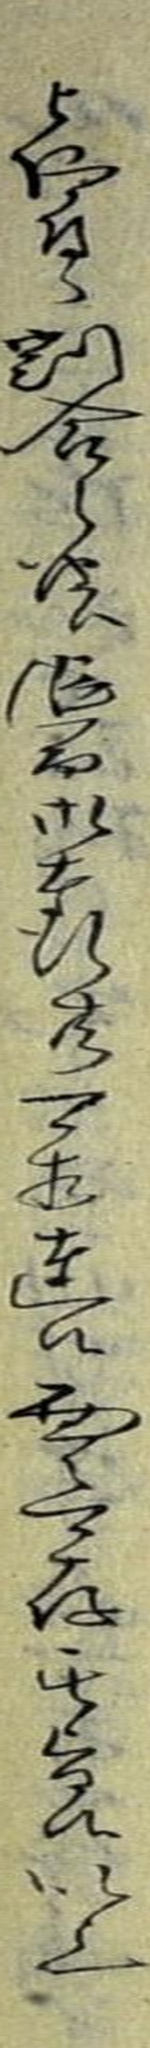被仰付候割合之儀ハ追而御奉行共可相達候面々可存其旨候以上
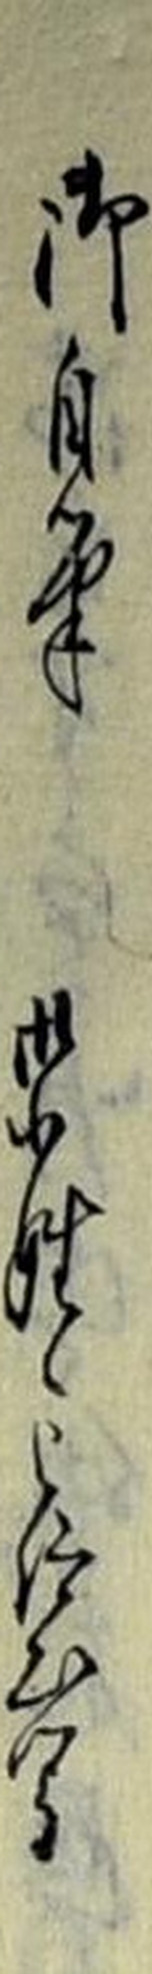御自筆御小姓へ被仰出写
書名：命令之部 一
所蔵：福井県文書館 Fukui Prefectural Archives
